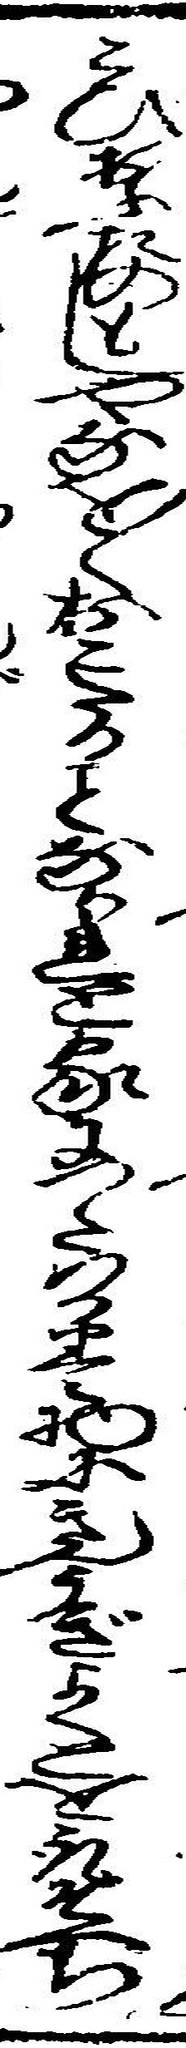こびおふたのもしやなを〳〵おこたることなかれと家につたはる書物にきんうぎよくとを取そへち
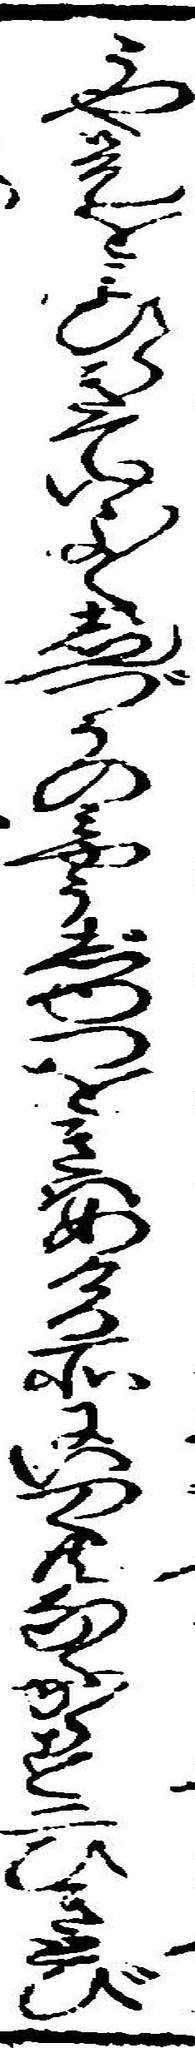うや是をみひらきていよ〳〵しんづうのみやうじゆつをきはめける所にいつく共なくからす二ひきとび
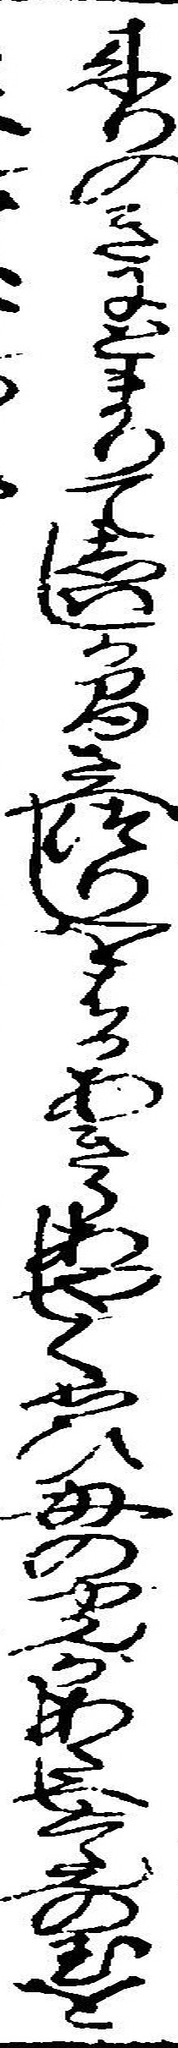来りのきにとまりてしはしか間さへつりしをはるあきらあやしく思ひ母のやかんかあたへしくたんの玉を
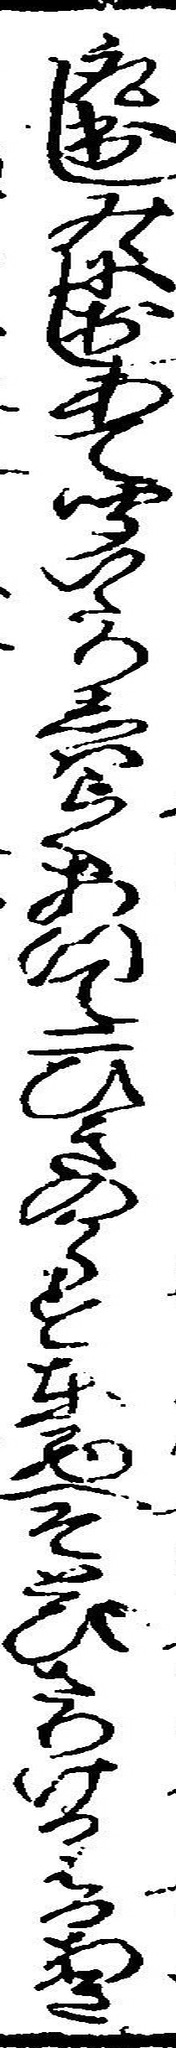取出しみゝにおしあて聞いたりしはらくあつて二ひきのからす東西へそとびさりけるはるあき
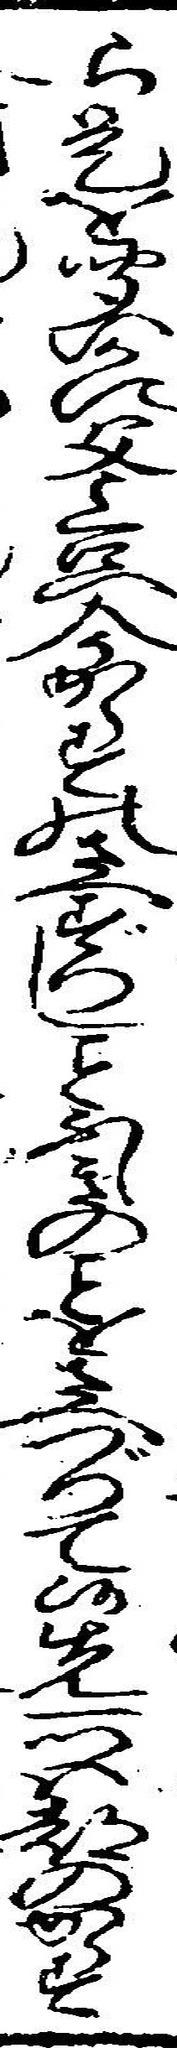ら是を聞いかに父上只今からすのさへずりしことふしきのことをさへづりて候先一つは都のからす
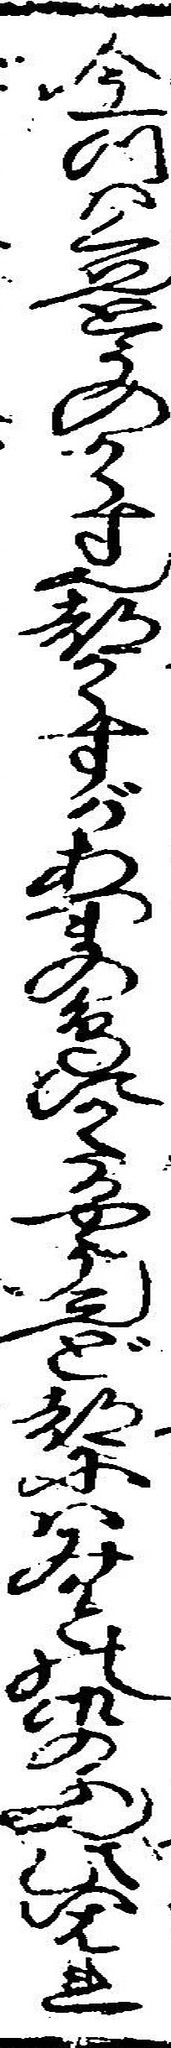今一つはくわんとうのからす也都からすがあつまの鳥にかたるやうこんど都にはみかとの御のふ也此いはれ
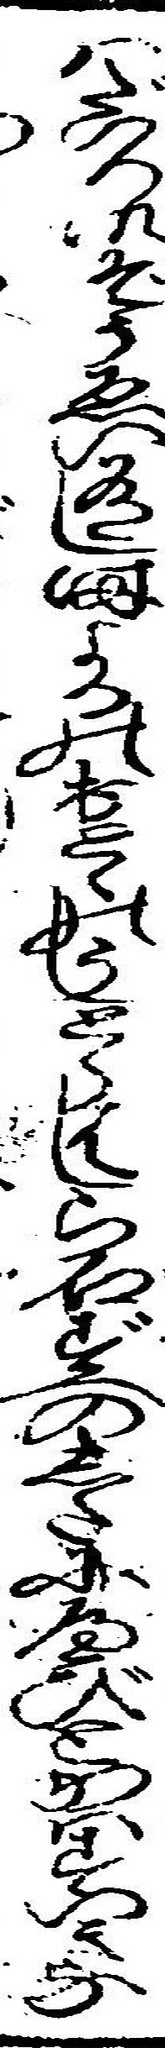はだいり御ぞうゑい有し時よるのおとゝのうしとらはしら石ずへのしたにへびとかはすいきな
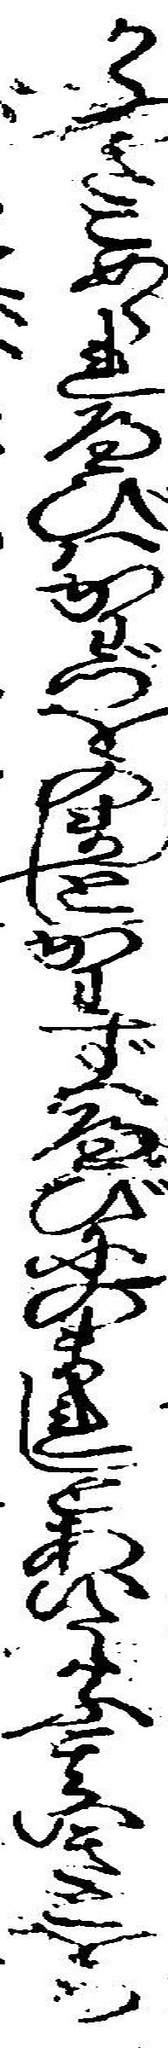からつきこめられへびはかわづをのまんとしかわずはへびにのまれしとあいたゝかふ其いきとをり
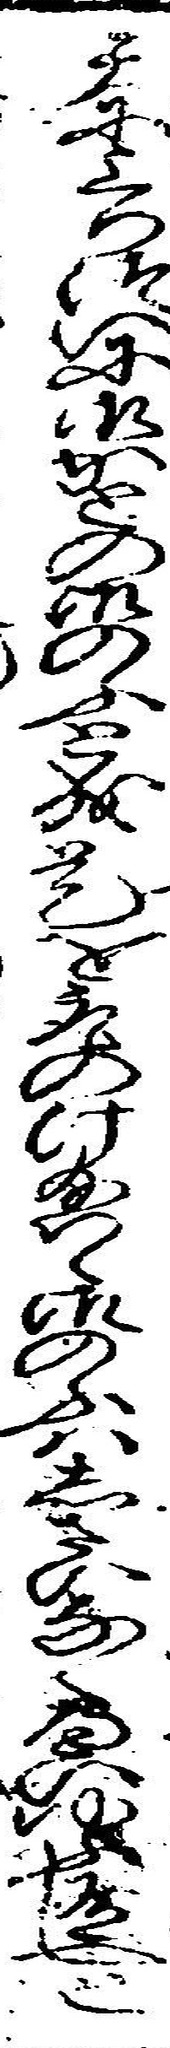天に上りついに御かとの御のふと成是を取のけ給はゝ御のふはしさいなくへいゆふ有へしと
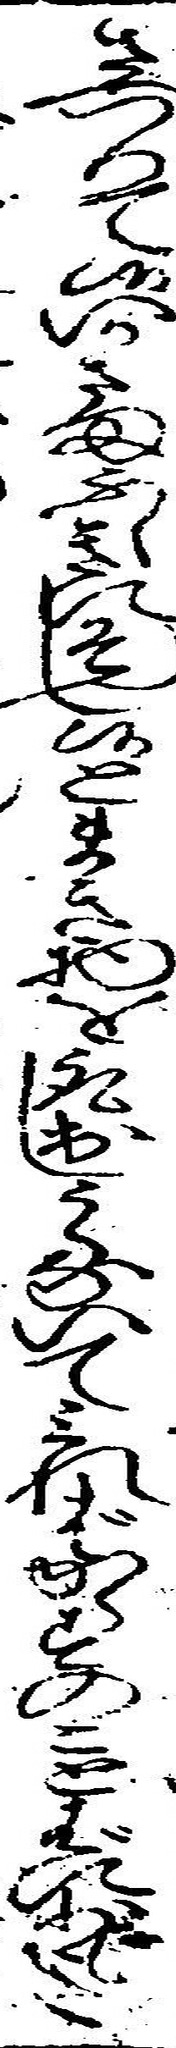さへつりて候いかさまふしきにそんし候とまき物を取出しうらないてみればからすのことばに少もた
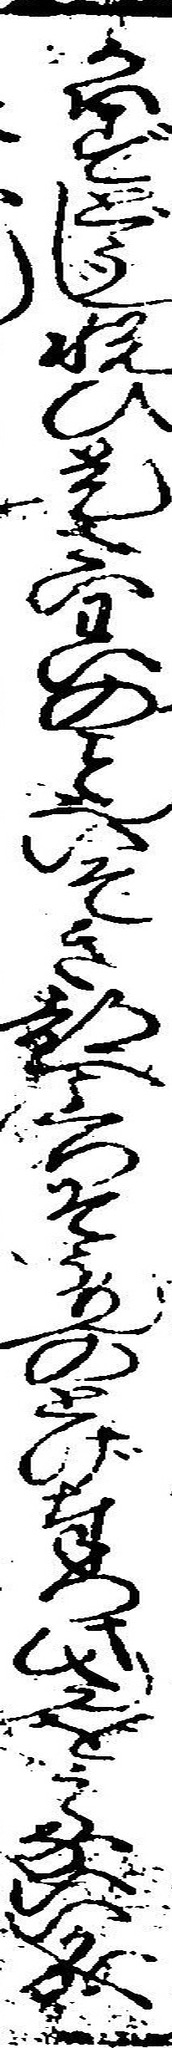かはずどうじ悦ひ是さいわいのこと也いそき都へ上りそうもんのとげ奉り此たんをうらないいか成
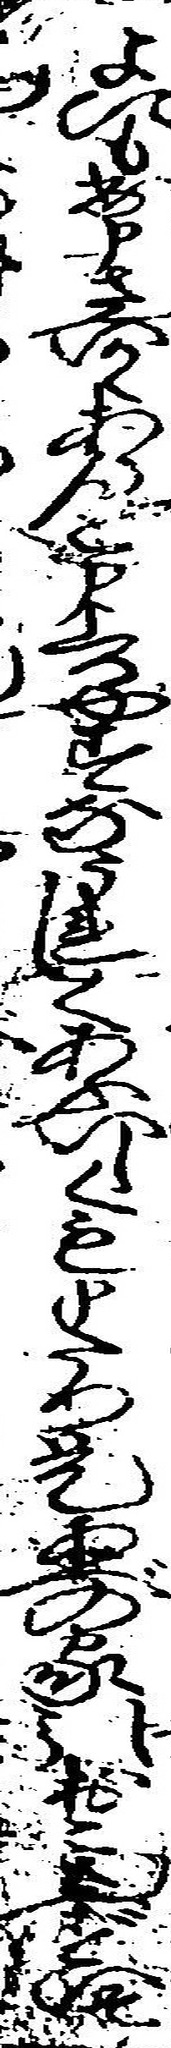よにも出申さんいかゝあらんと申上るやすなうれしくあふいしくも申たり是あべの家引おこさんずいそ

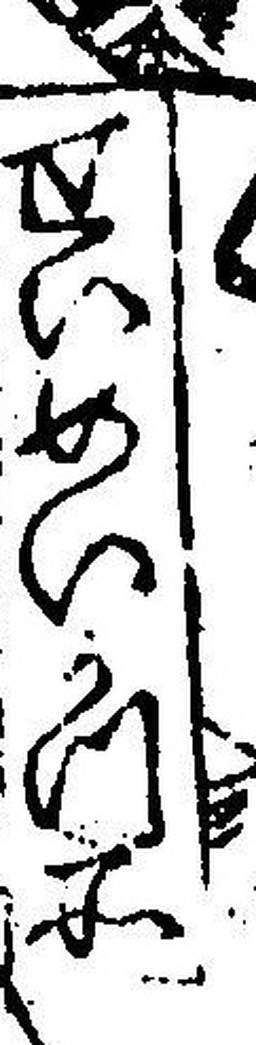せいめいかつ所
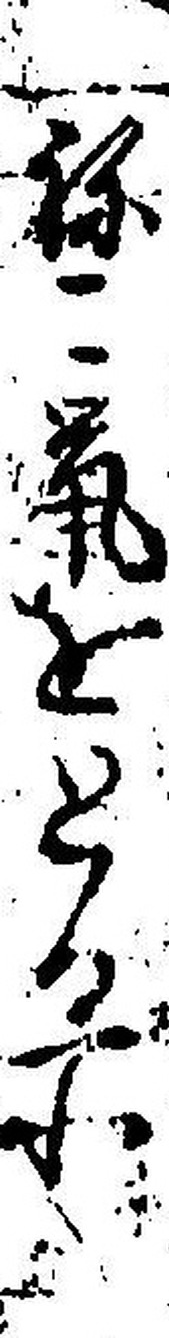ねこ鼠をとる所
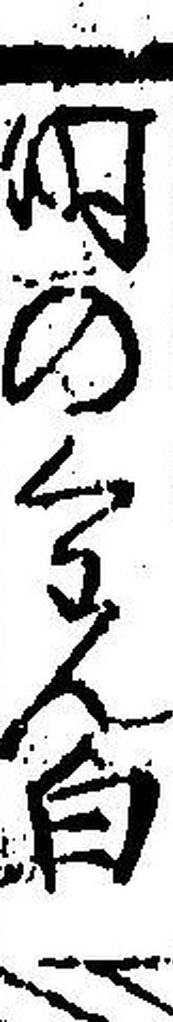時？のくわん白
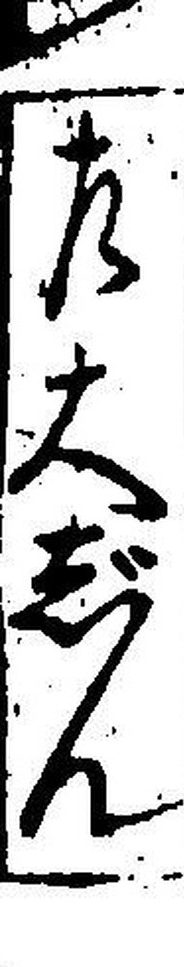左大じん
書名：[しのだづまつりぎつね付あべの清明出生]
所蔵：東京大学総合図書館 General Library in the University of Tokyo, JAPAN
